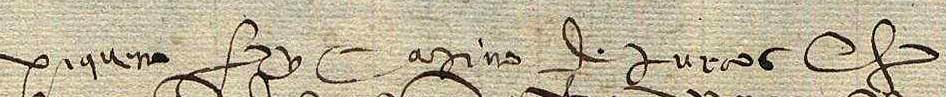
piqueno foy Catiuo de turcos e ho
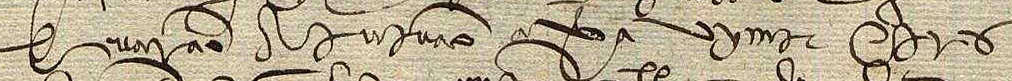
leuarão A tutuão aꝟa vymte e tres
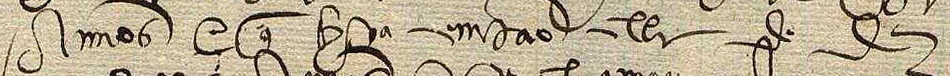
Ann̄os e q̄ ꞩya emtaõ elle de dez
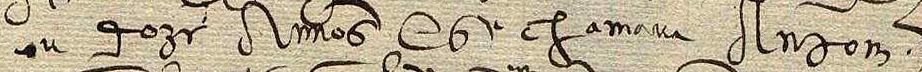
ou doze Annōs e se chamaua Antom.
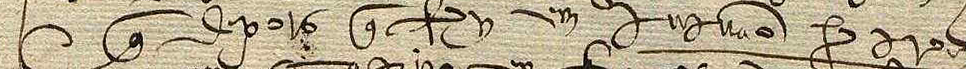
e q̄ depojs q̄ foy em tutuão ho trou
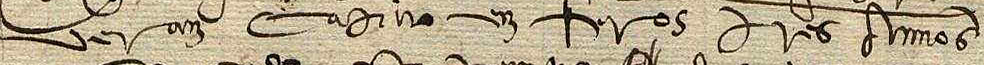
veram Catiuo em feros tres Annōs
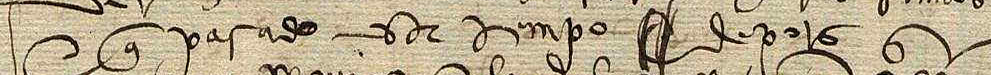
e q̄ pasado este tempo e depojs se
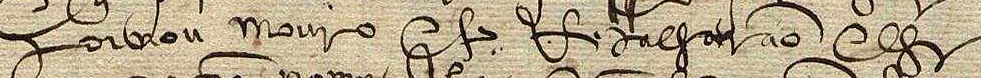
tornou mouro e ho Retalharaõ e lhe
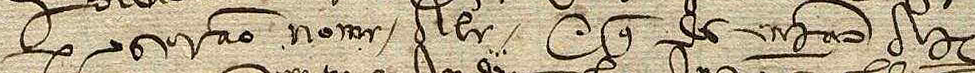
poserão nome / Ale / e q̄ des então Ate
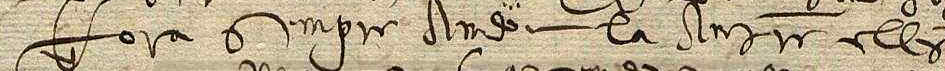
gora sempre Andou la Antre elles
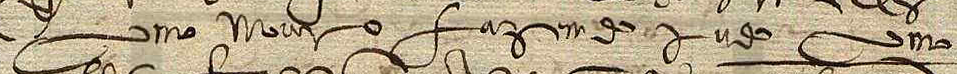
Como mouro fazemdo tudo Como
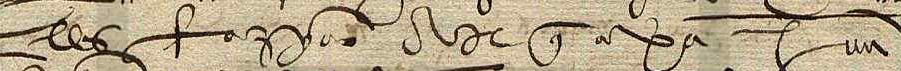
elles fazyão Ate q̄ aꝟa hūu
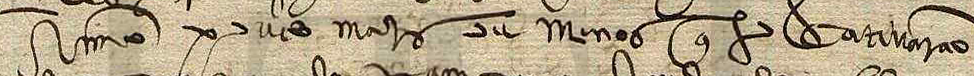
Anno pouco majs ou menos q̄ ho catiuarão
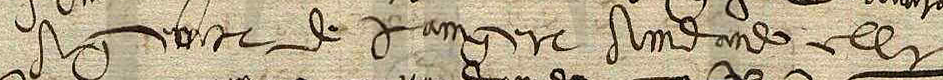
A gemte de tamgere Amdando elle
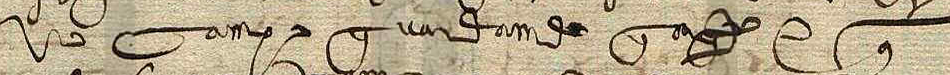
no Campo guardamdo gagdo e q̄
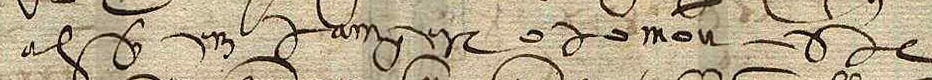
ahy em tamgere o tomou este
